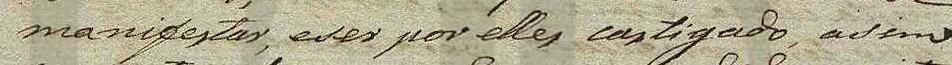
manifestar, e ser por elles castigado, asim
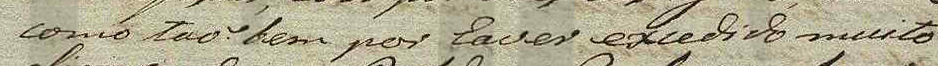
como taõbem por haver excedido muito
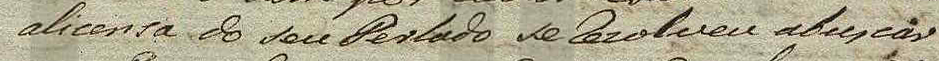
a licensa do seu Perlado se Rezolveu a buscar
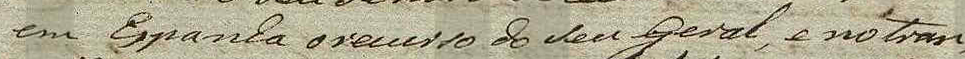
em Espanha o recurso do seu Geral, e no tran
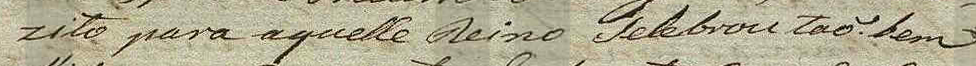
zito para aquelle Reino selebrou taõbem
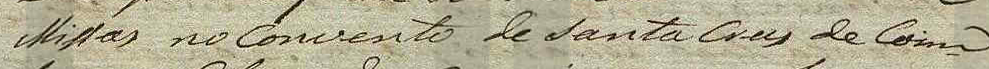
Missas no Convento de santa Crus de Coim
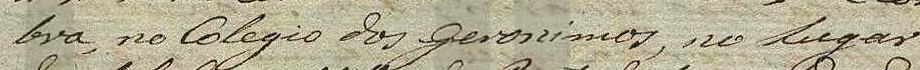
bra no Colegio dos Geronimos, no Lugar
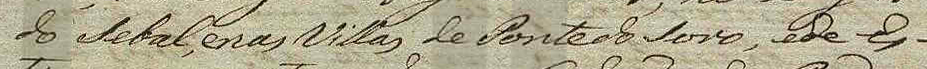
do Sebal, e nas Villas de Ponte do soro, e de Es
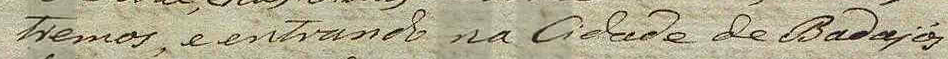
tremos, e entrando na Cidade de Badajós
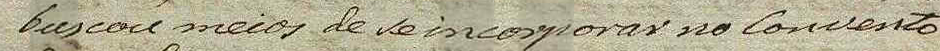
buscou meios de se incorporar no Convento
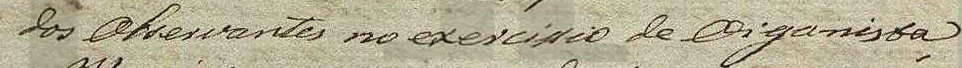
dos Observantes no exercissio de Organista,
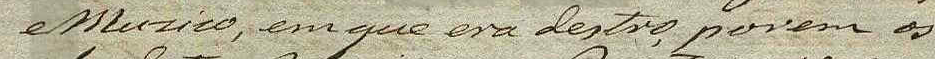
e Muzico, em que era destro, porem os
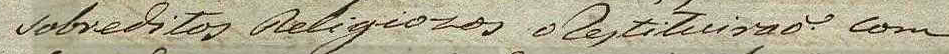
sobreditos Religiozos o Restituiraõ com
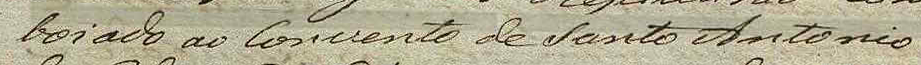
boiado ao Convento de Santo Antonio
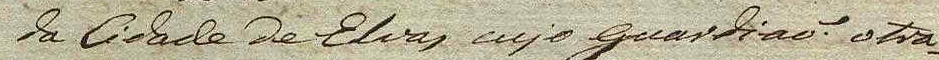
da Cidade de Elvas cujo Guardiaõ o tra
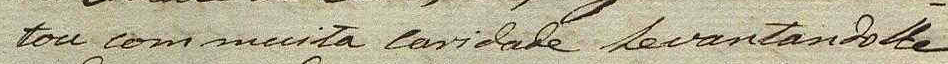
tou com muita caridade Levantandolhe
